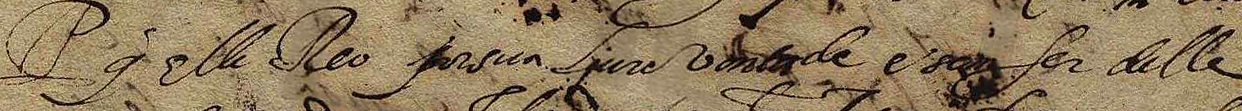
P. q̄ Elle Reo por sua Liure vontade e sem ser delle
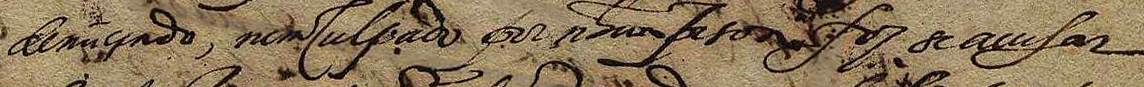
denūciado, nem Culpado por nh̄ua pesoa foj se acusar
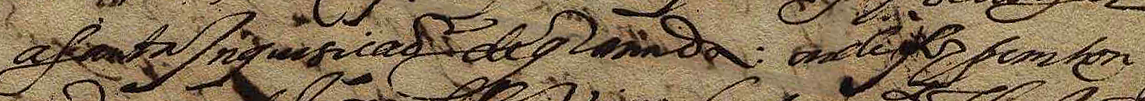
a santa Jnquisicaõ de granada: onde foy peniten
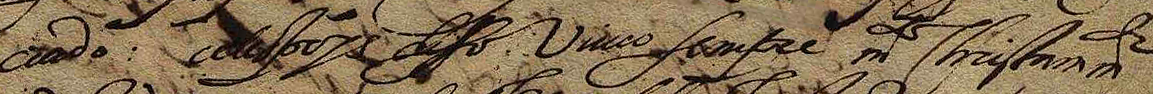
ciado: e despojs disso uiueo sempre mto Christammte
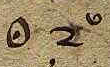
O 2o
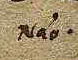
Não.
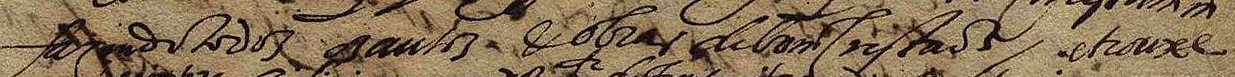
fazendo todos os autos & obras de bom Cristaõ / e trouxe
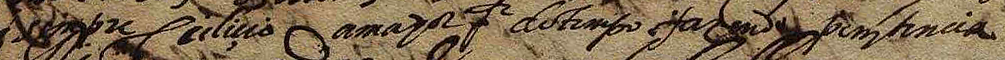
sempre aliuio a mayor pte do tempo fazendo penitencia
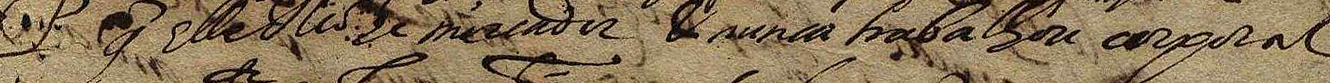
P. q̄ Elle Reo he mercador & nunca trabalhou corporal
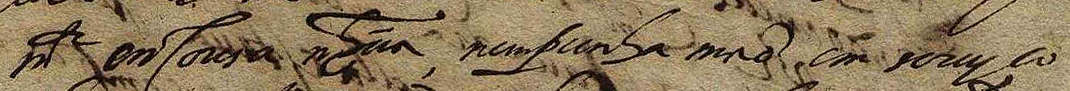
mte en Cousa nhūa, nem punha maõ em seruyço
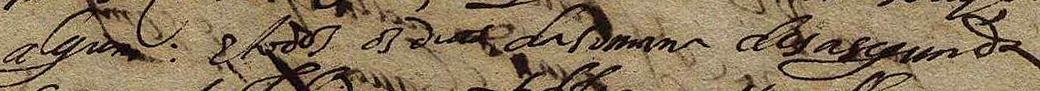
algum: e todos os dias da somana des a segunda
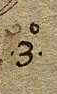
3.o
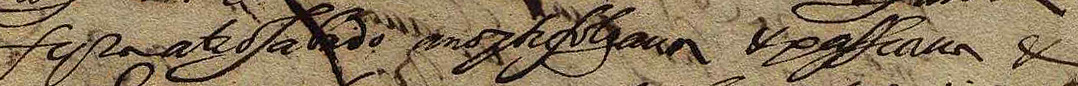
fejra ate o sabado a nojte folgaua & passaua &
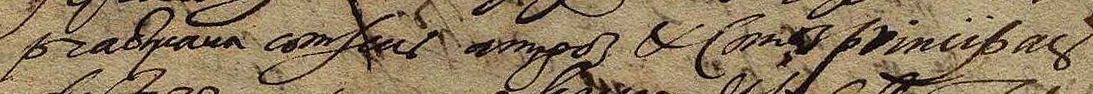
practicaua com seus amigos & Com os principaes
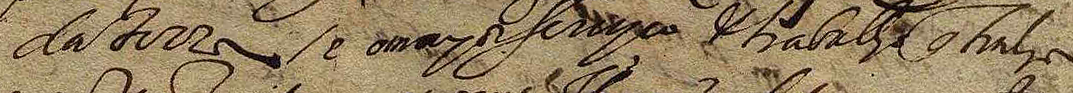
da terra se o mayor seruyco & trabalho q̄ tinha
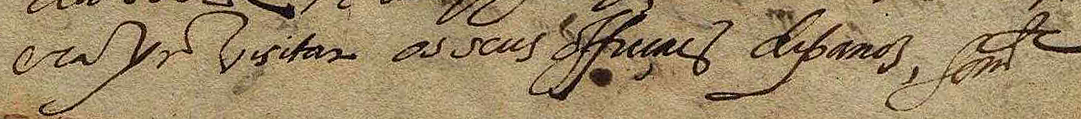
era yr visitar os seus officiaes de panos, somte
